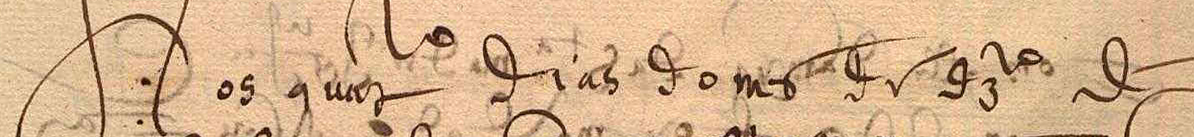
Aos quatro dias do mes de dzro de
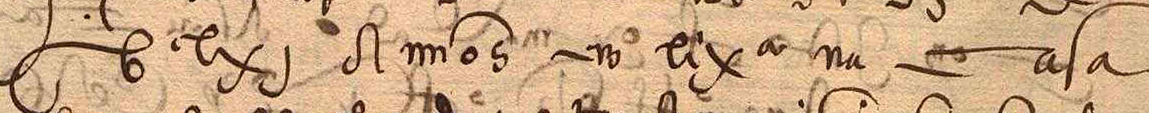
j̄ bc lxj Annōs em lixa na Casa
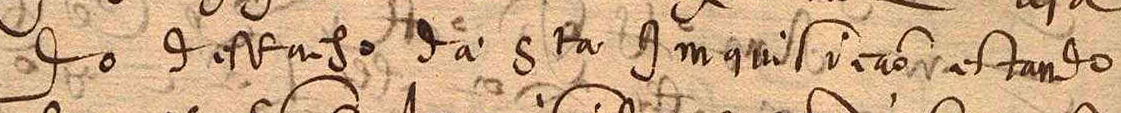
do despacho da Sta Jmquisiçaõ estando
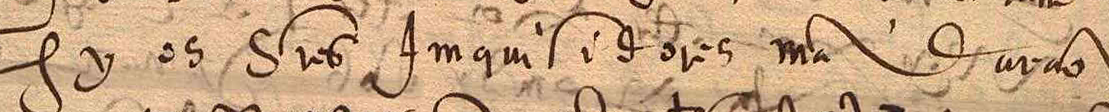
hy os Srēs Jmquisidores mādaraõ
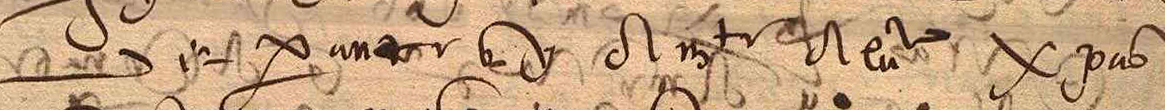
vir ꝑante sy A mte Aluro Xpaõ
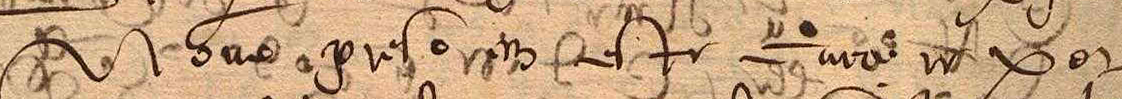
Nouo preso em este Carcere por
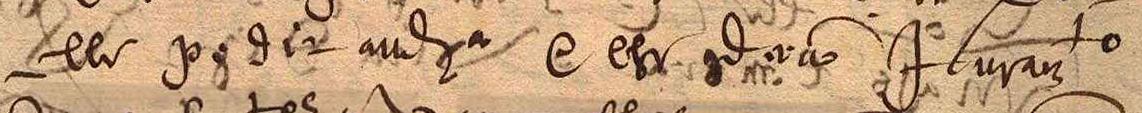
elle pedir audja e lhe derão Juramto
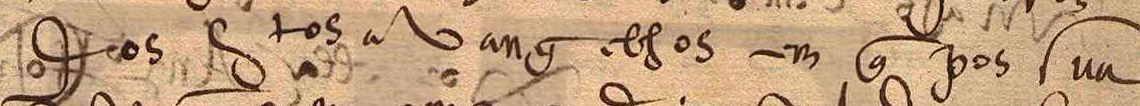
dos Stos avangelhos em q̄ pos sua
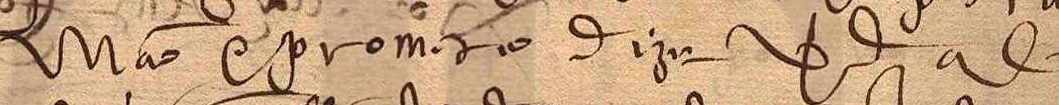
mão e prometeo dizer ꝟdade
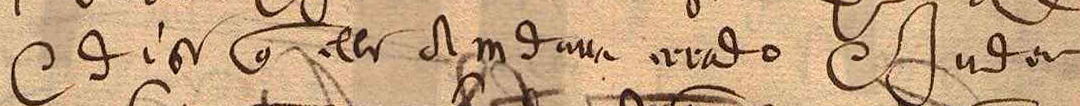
e dise q̅ elle Amdaua errado e Judeu
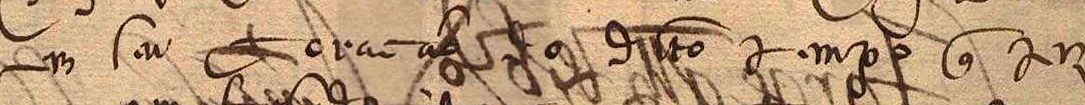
em seu Coraçaõ do dito tempo q̄ tem
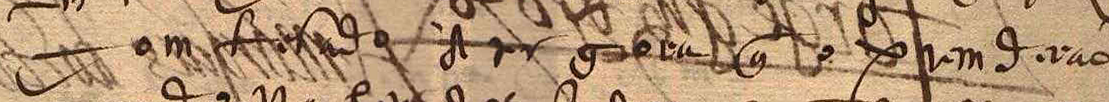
Comfesado Atee gora q̄ o premderaõ
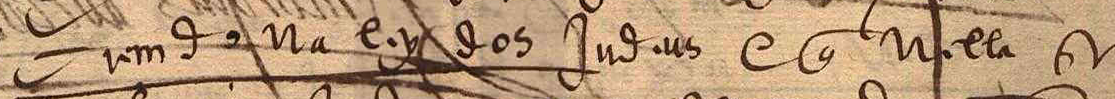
Cremdo na ley dos Judeus e q̄ nella se
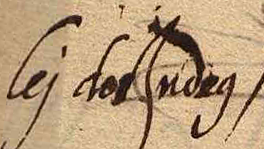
lej dos Judeꝯ /
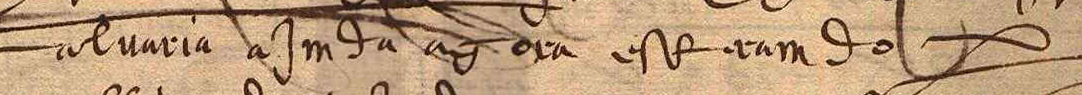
saluaria aJmda agora esperamdo ꝑ
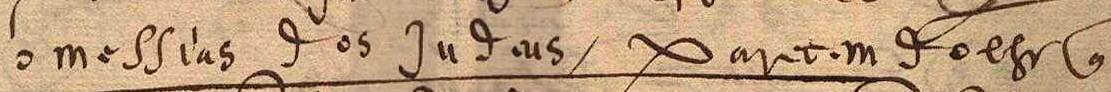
o messias dos Judeus / parecemdolhe q̄
